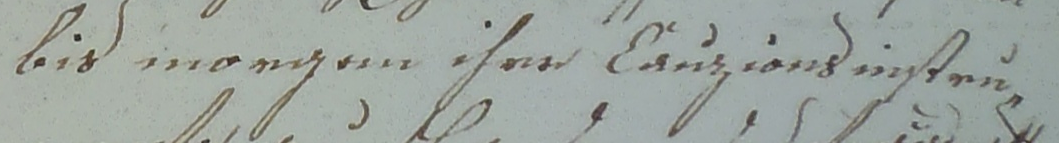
bis morgen ihre Cauzionsinstru¬
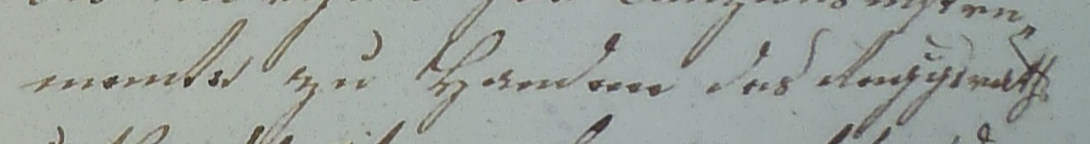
mente zu Handen des Reg͞gsraths
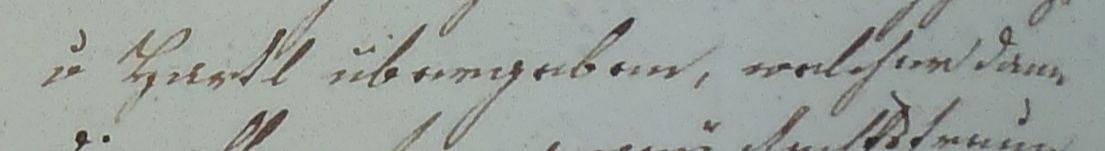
v Hartl übergeben, welcher dann
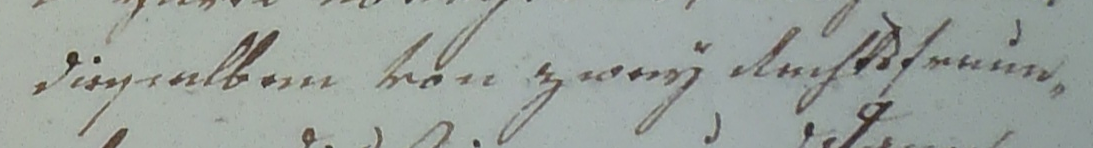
diesselben von zwey Rechtsfreun¬
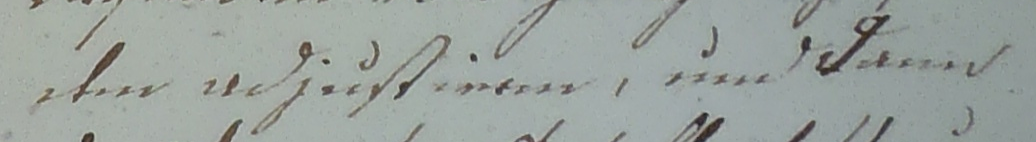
den adjustiren, und dann
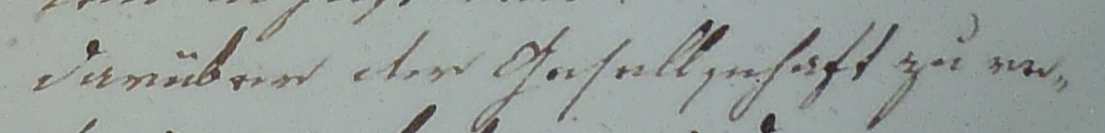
darüber der Gesellschaft zu re¬
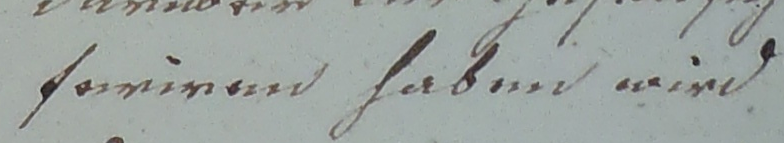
feriren haben wird
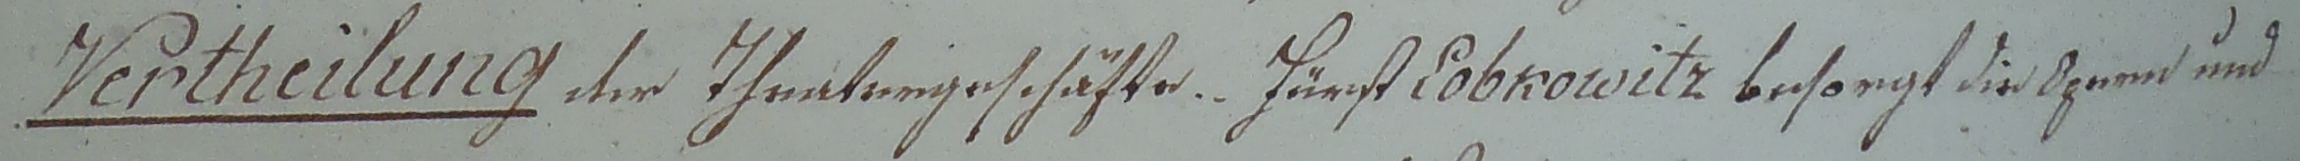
Vertheilung der Theatergeschäfte .. Fürst Lobkowitz besorgt die Opern und
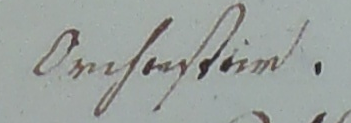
Orchester.
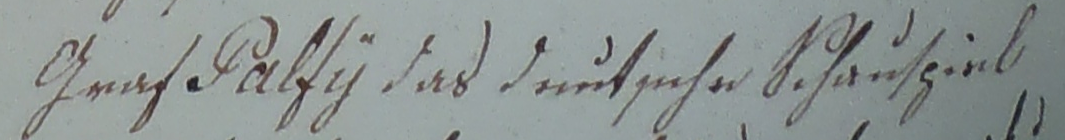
Graf Palfy das deutsche Schauspiel
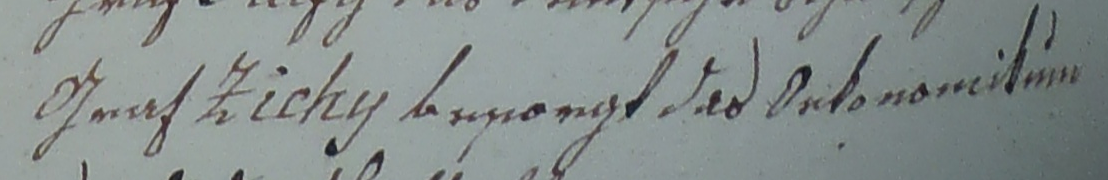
Graf Zichy besorgt das Oekonomikum
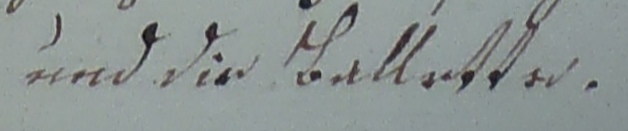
und die Ballette.
